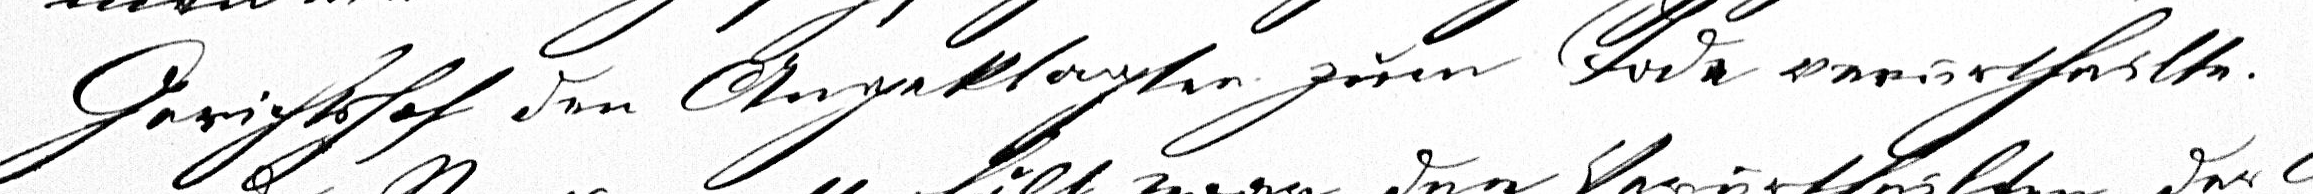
Gerichtshof den Angeklagter zum Tode verurtheilte.
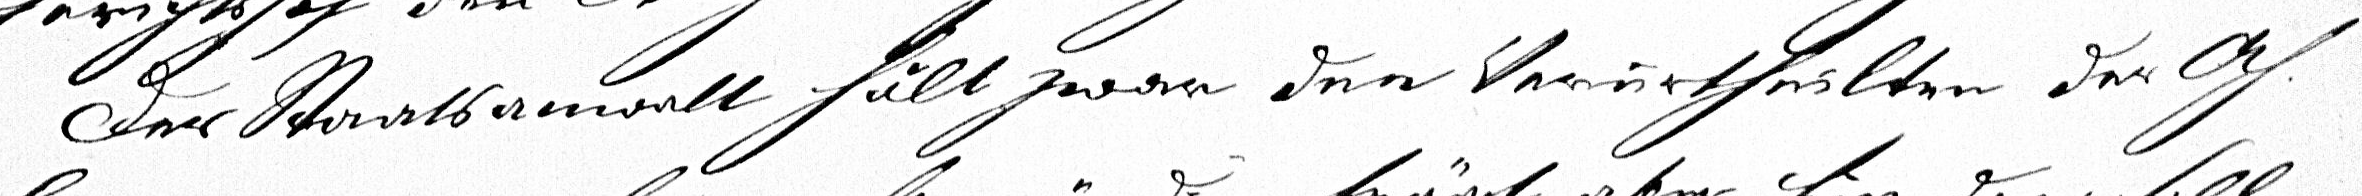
Der Staatsanwalt hält zwar den Verurtheilten der As.
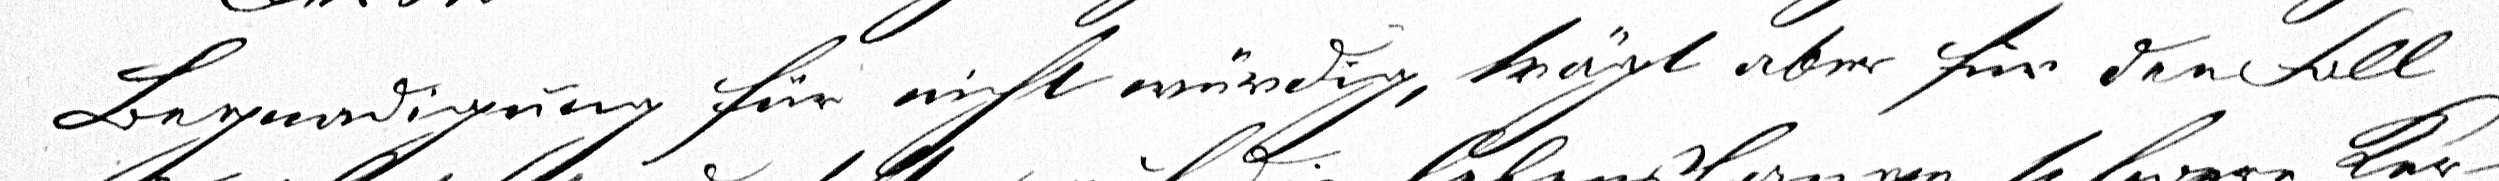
Begnadigung für nicht würdig, trägt aber für den Foll
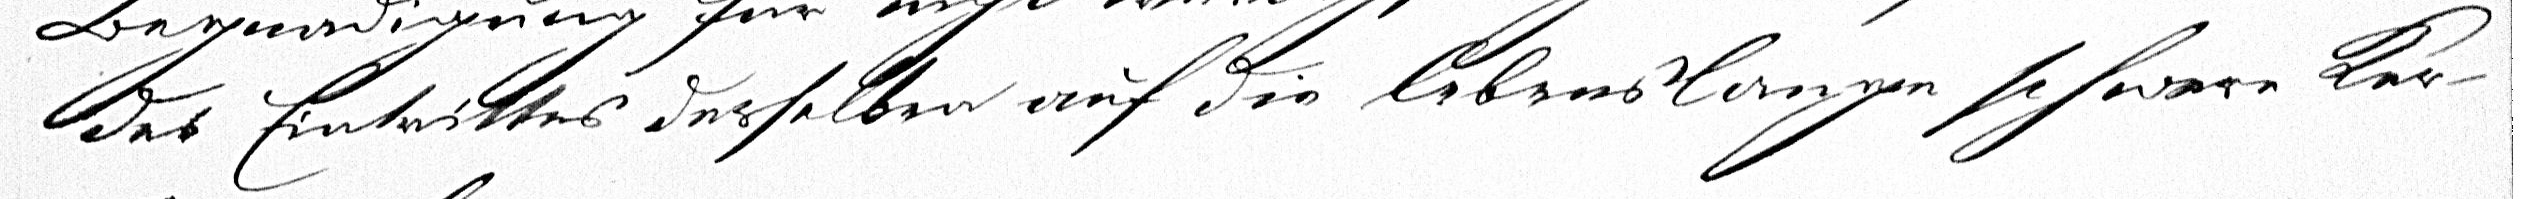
des Eintrittes desselben auf die lebenslange schwere Ker¬
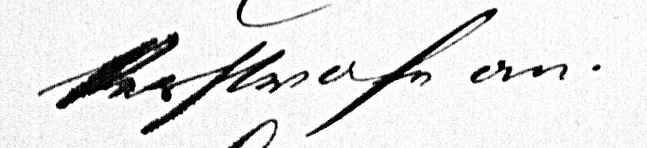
kerstrafe an.
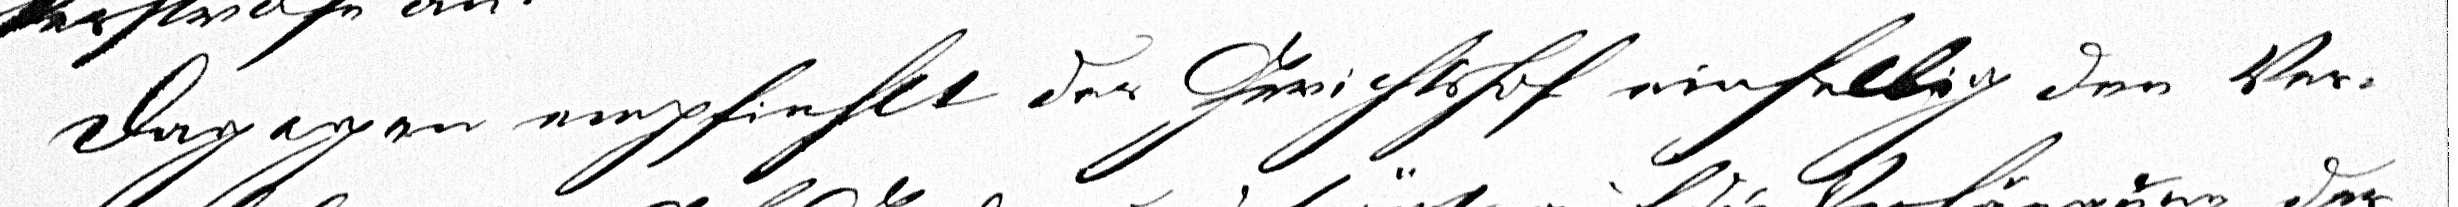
Dagegen empfiehlt der Gerichtshof einfellig den Ver¬
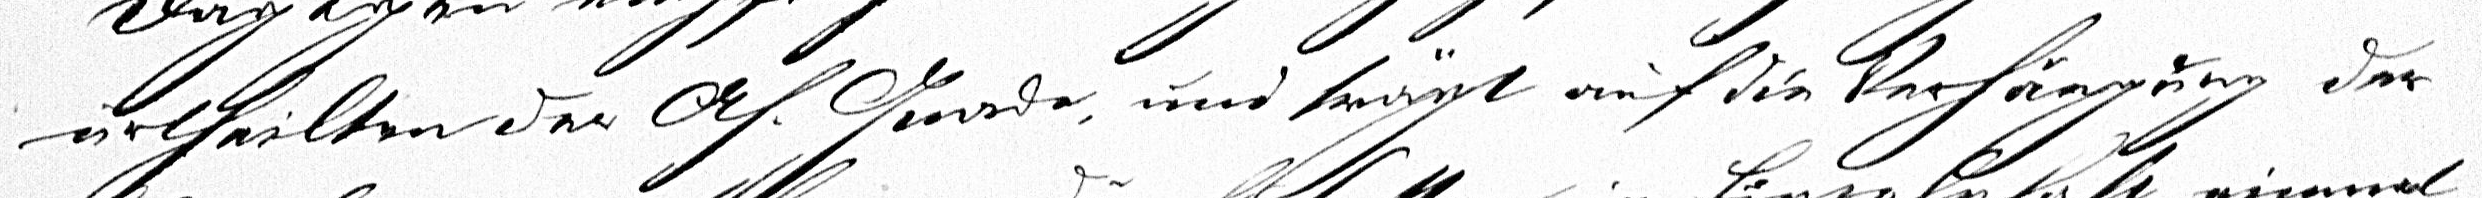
urtheilten der As. Gnade, und trägt auf die Verhängung der
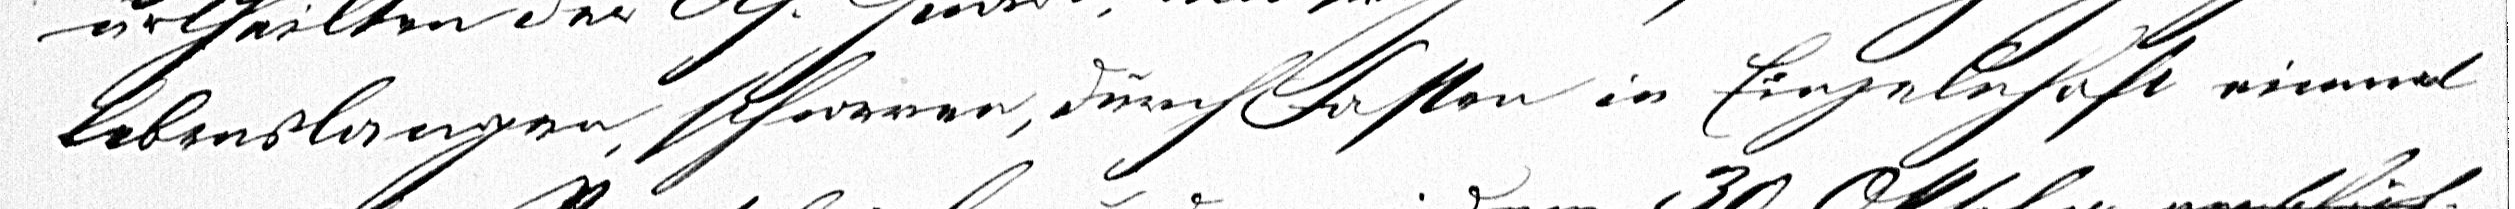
lebenslangen schwere, durch Fasten in Einzelnhaft einmal
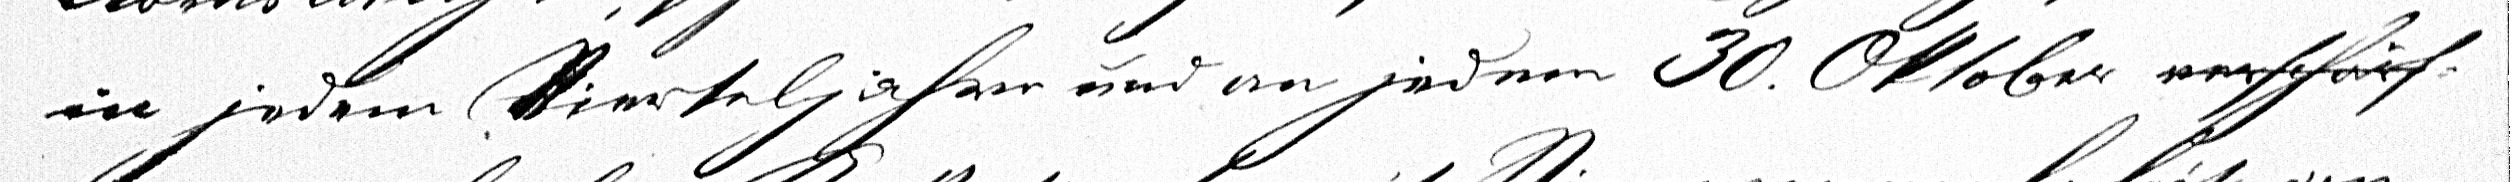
in jedem Vierteljahren und an jedem 30. Oktober verschärf¬
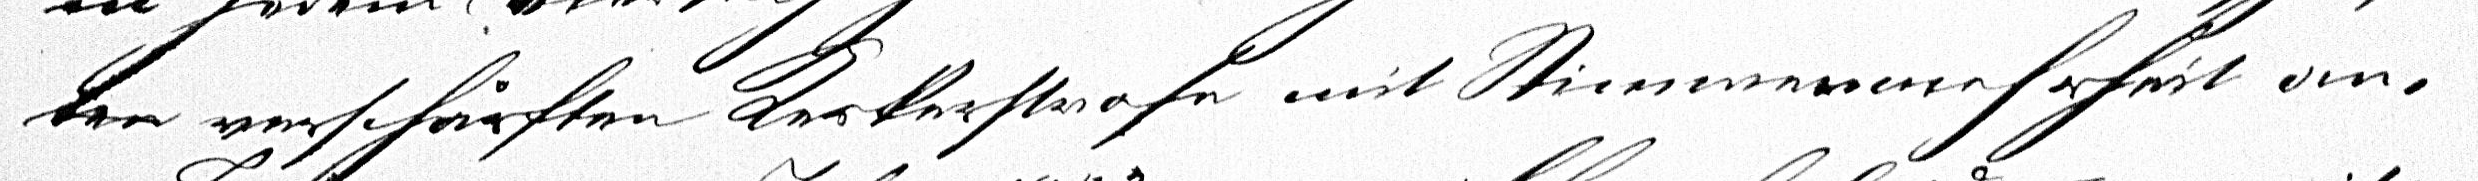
ten Kerkerstrafe mit Stimmenmehrheit am
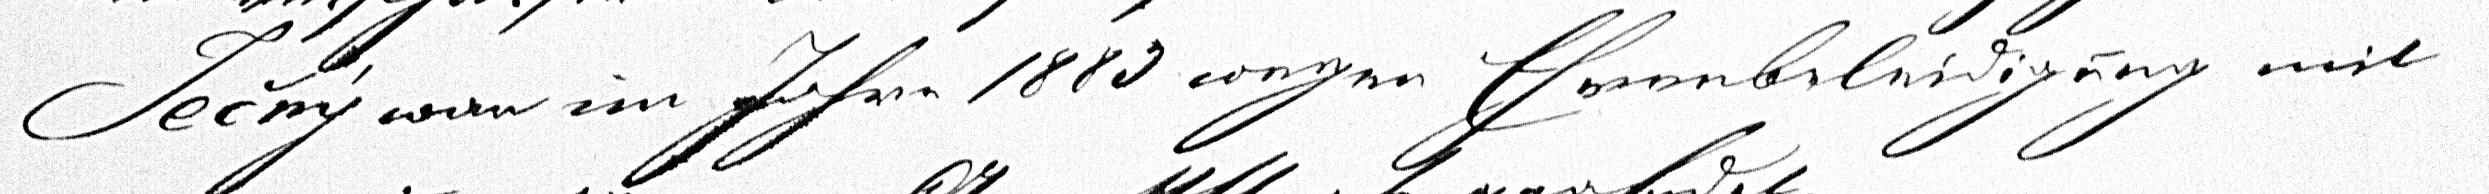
Jecný war im Jahre 1883 wegen Ehrenbeleidigung mit
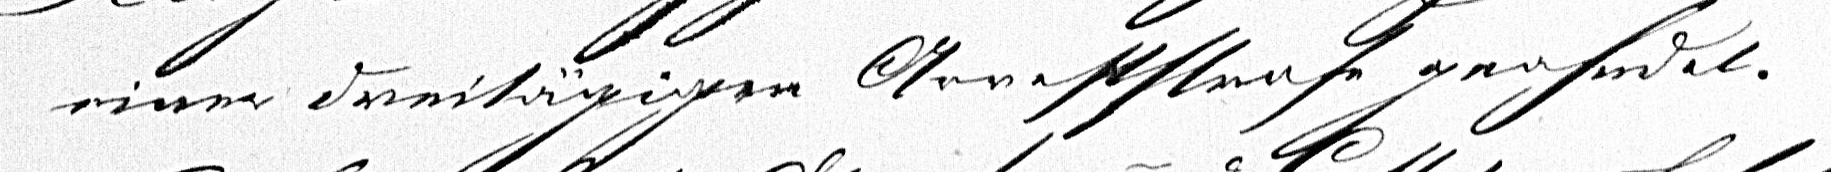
einer dreitägigen Arreststrafe gnafindet.
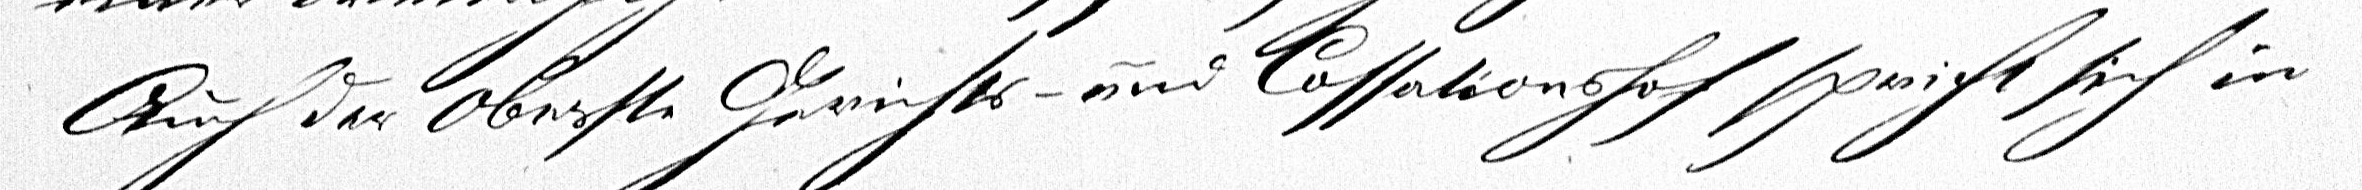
Auch der oberste Gerichts- und Cossationshof spricht sich in
